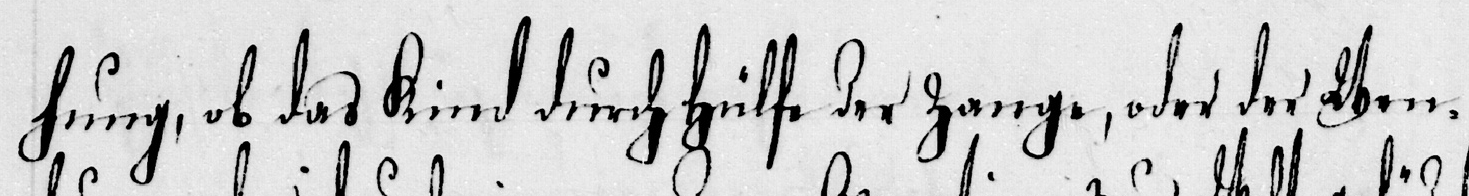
hung, ob das Kind durch Hülfe der Zange, oder der Wen¬
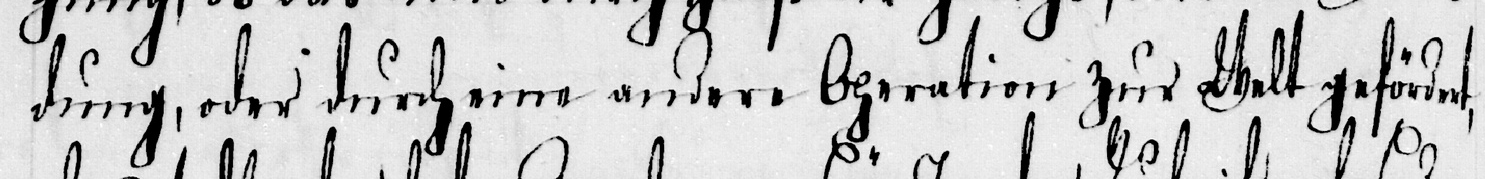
dung, oder durch eine andere Operation zur Welt geförde¬
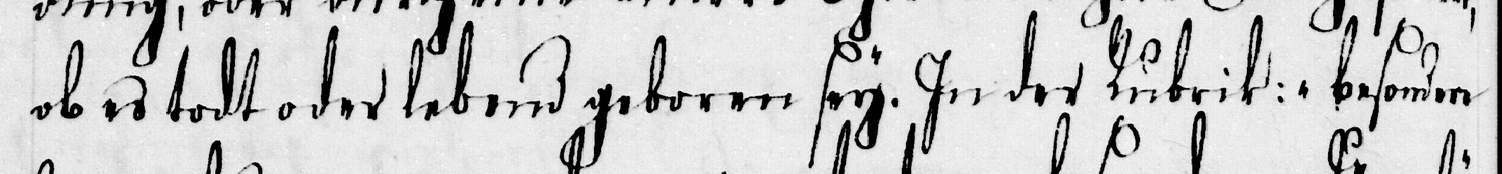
ob es todt oder lebend geboren sey. In der Rubrik: „besondere
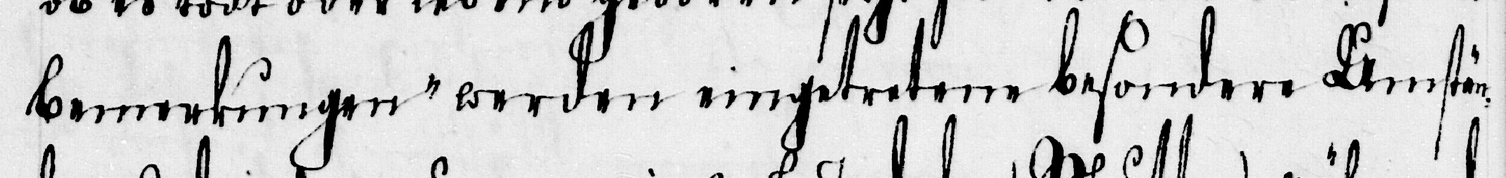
Bemerkungen“ werden eingetretene besondere Umstän¬
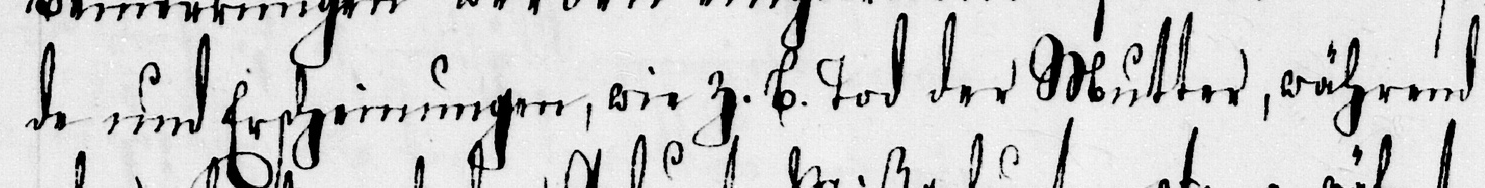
de und Erscheinungen, wie z.B. Tod der Mutter, während
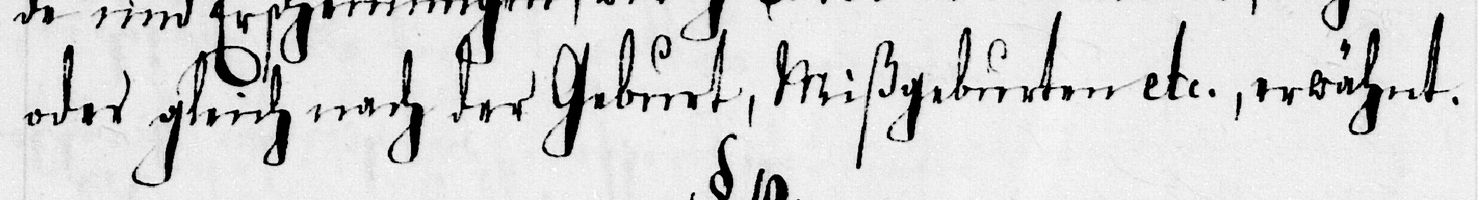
oder gleich nach der Geburt, Mißgeburten etc., erwähnt.
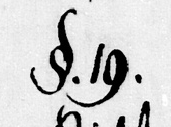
§. 19.
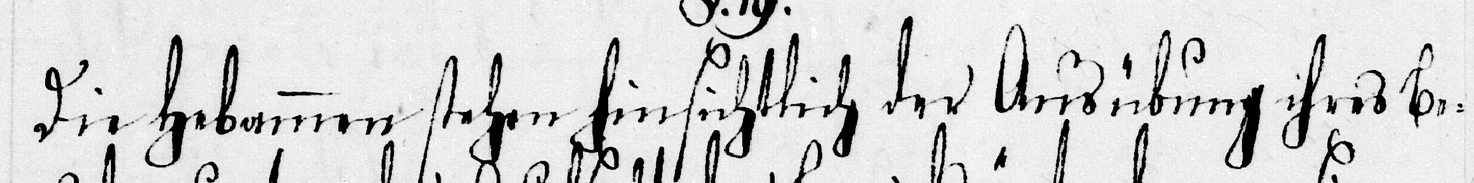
Die Hebammen stehen hinsichtlich der Ausübung ihres B¬
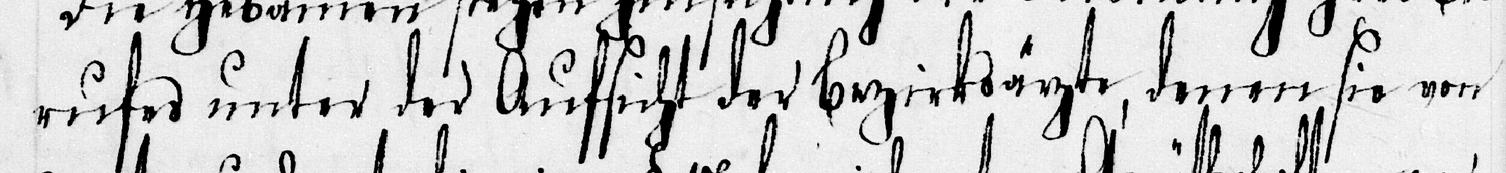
erufes unter der Aufsicht der Bezirksärzte, denen sie von
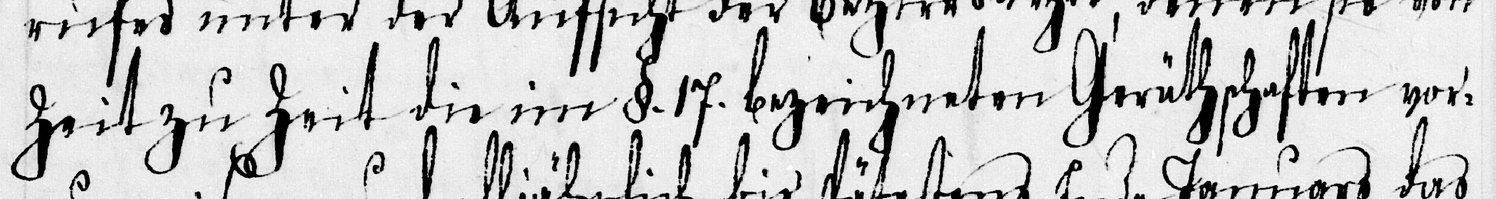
Zeit zu Zeit die im §.17. bezeichneten Geräthschaften vor¬
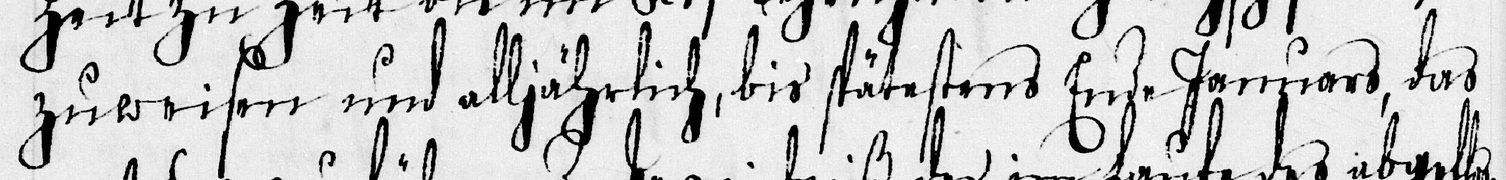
zuweisen und alljährlich, bis spätestens Ende Januars, das
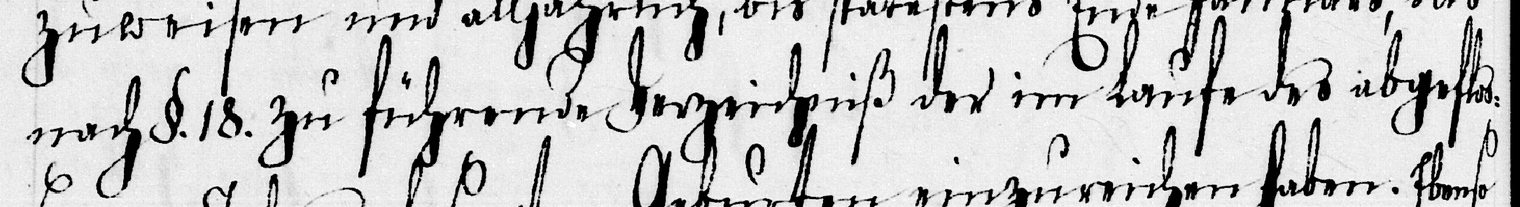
nach §.18. zu führende Verzeichniß der im Laufe des abgeflo¬
